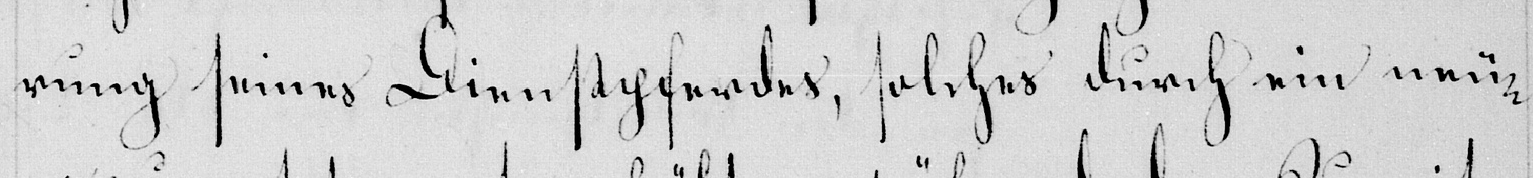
rung seines Dienstpferdes, solches durch ein neu¬
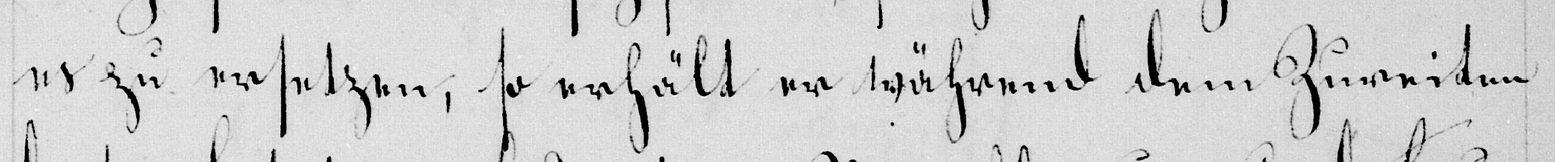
es zu ersetzen, so erhält er während dem Zureiten
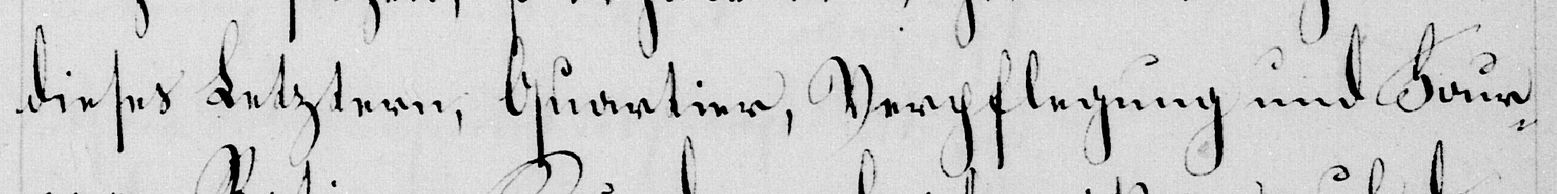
dieses Letztern, Quartier, Verpflegung und Four¬
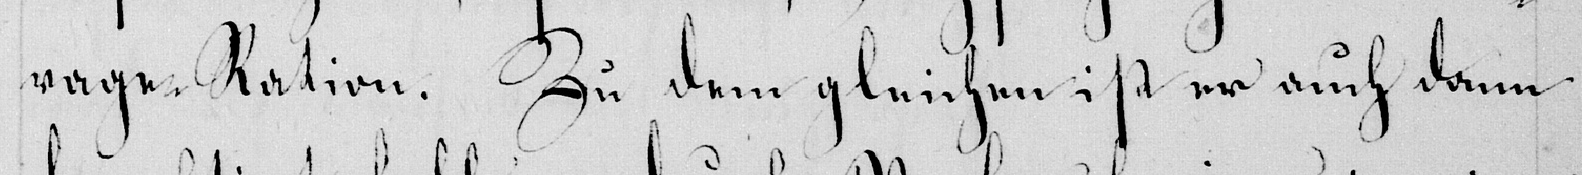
rage-Ration. Zu dem gleichen ist er auch dann
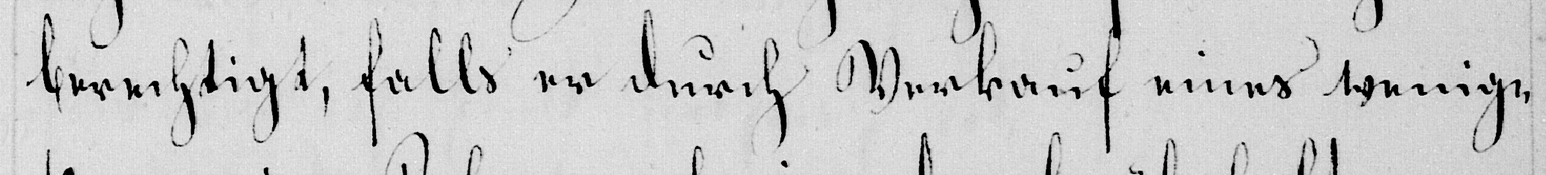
berechtigt, falls er durch Verkauf eines wenigs¬
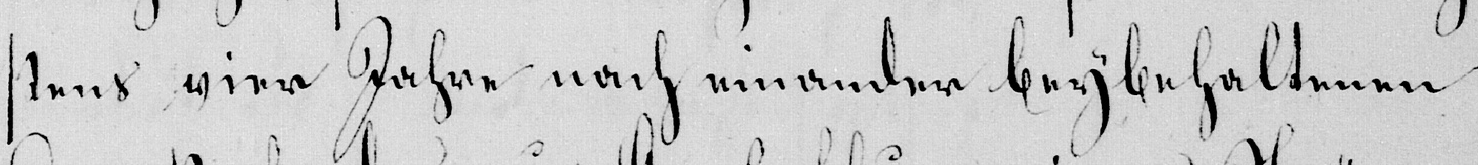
tens vier Jahre nach einander beybehaltenen
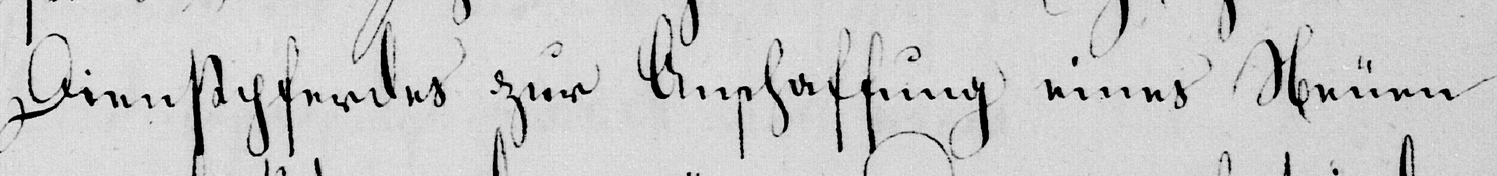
Dienstpferdes zur Anschaffung eines Neuen
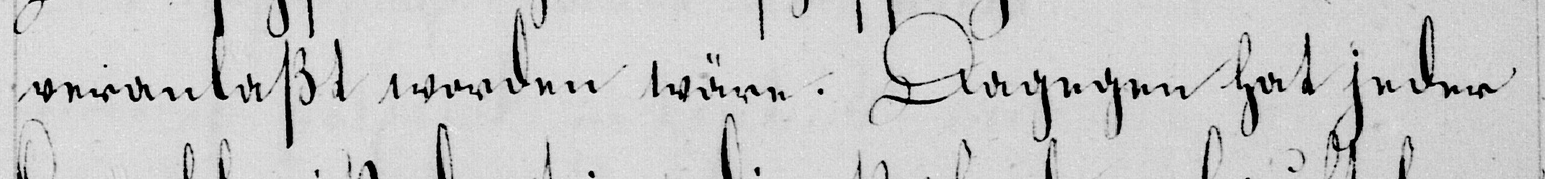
veranlaßt worden wäre. Dagegen hat jeder
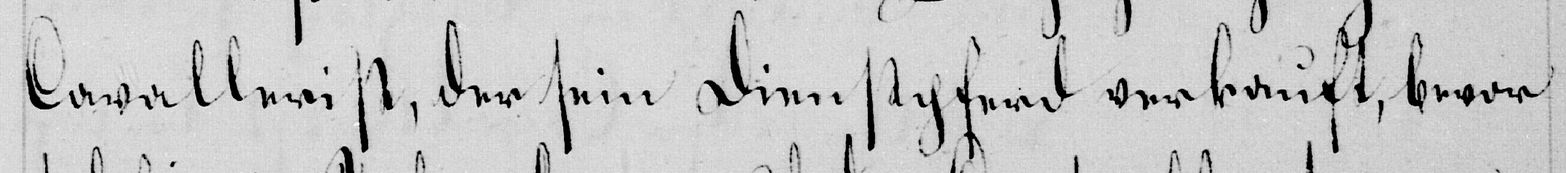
Cavallerist, der sein Dienstpferd verkauft, bevor
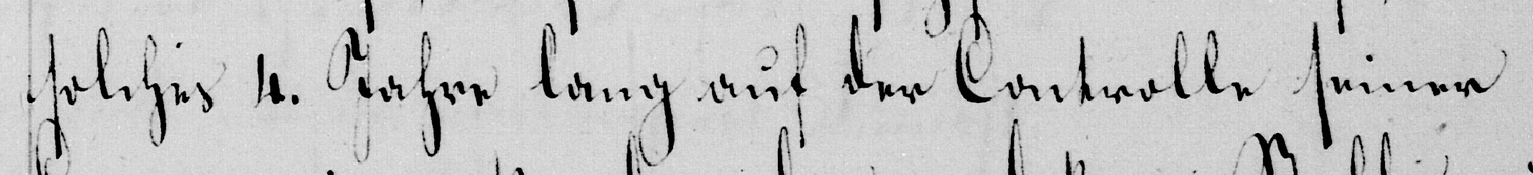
solches 4. Jahre lang auf der Controlle seiner
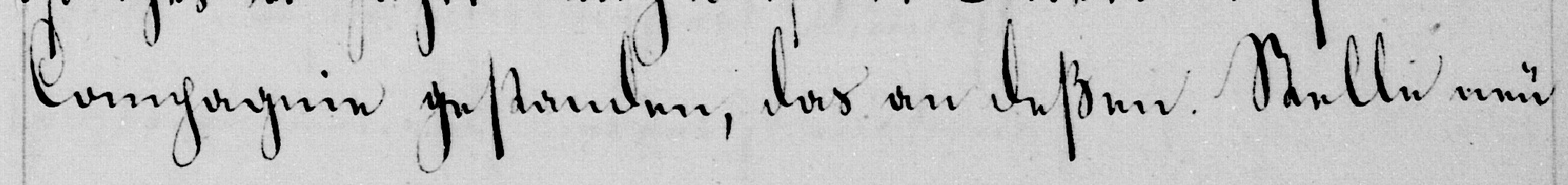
Compagnie gestanden, das an deßen Stelle neu
